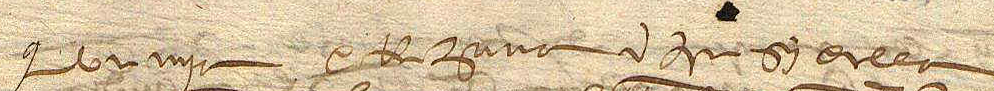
ꝯ dormja e Rezaua ētre sy e ella
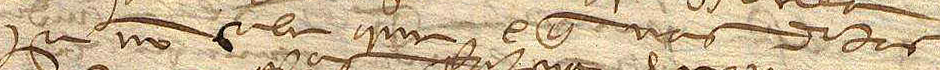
ta n̄o sabe que e q̄ nas ditas
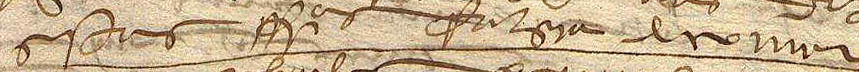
sestas ffras fazya de comer
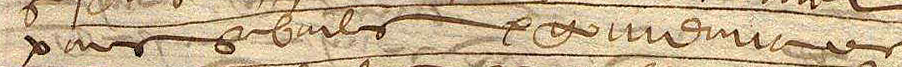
ꝑa os sabados e goardaua os
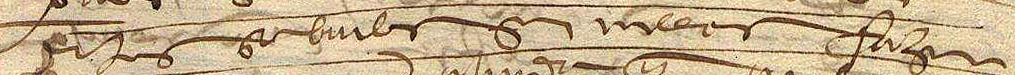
ditos sabados sem nelles fazer
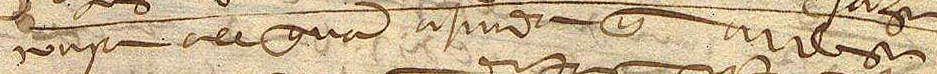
cousa allgūa aJmda q̄ ardese
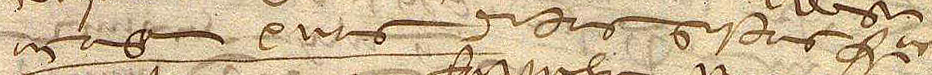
a casa e nas ditas sestas fras
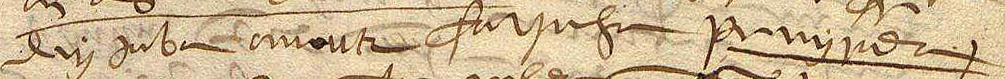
deytava a noute farjnha penyrada
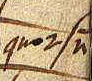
quor sū
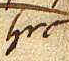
hec
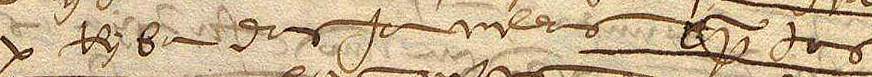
ꝑ Ryba das janellas e p̄otas
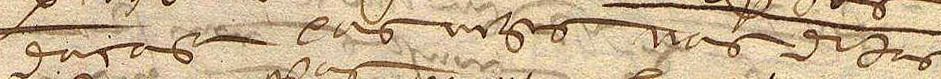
da casa e as uezes nas ditas
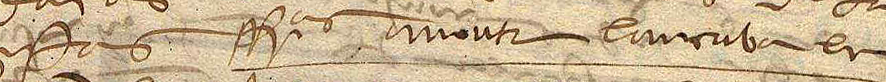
sestas ffras a noute lançava len
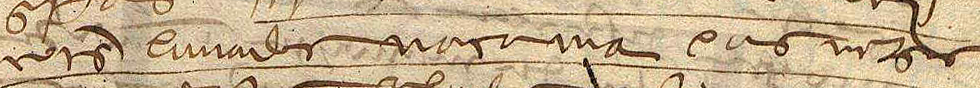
çoes lauados na cama e as uezes
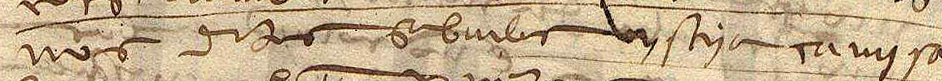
nos ditos sabados vystya camjsa
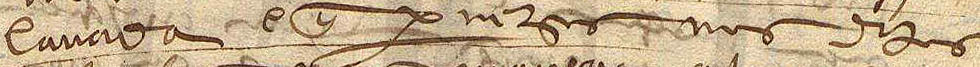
lauada e q̄ ꝑ uezes nos ditos
